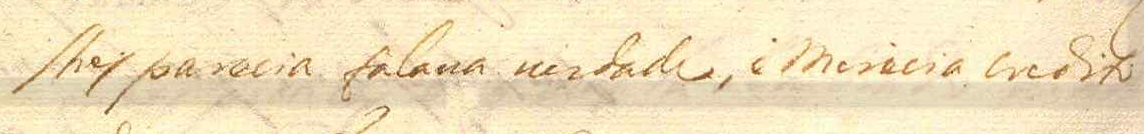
lhes parecia falaua uerdade, e merecia credito
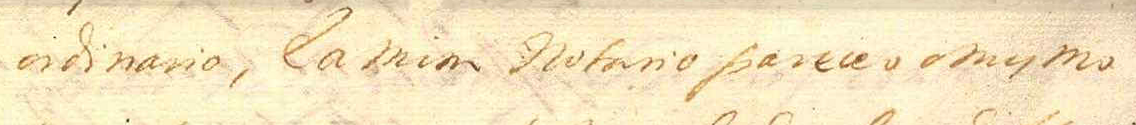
ordinario, e a mim notario pareceo o mesmo
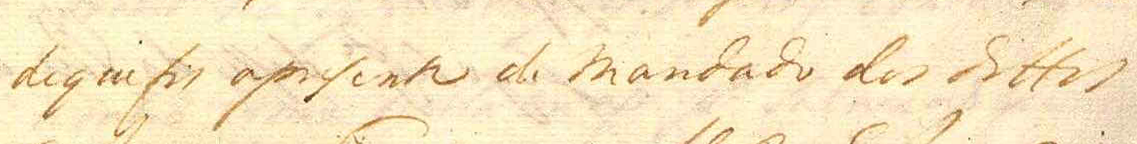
de que fis a presente de mandado dos dittos
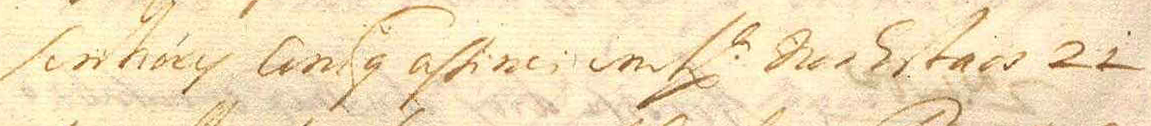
Senhores com q̄ assinei em Lxa. nos Estaos 21
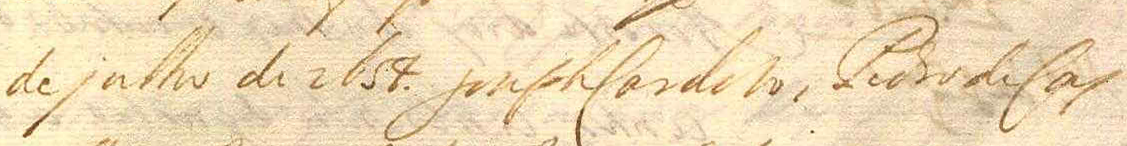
de julho de 1654. Jozeph Cardozo, Pedro de Cas
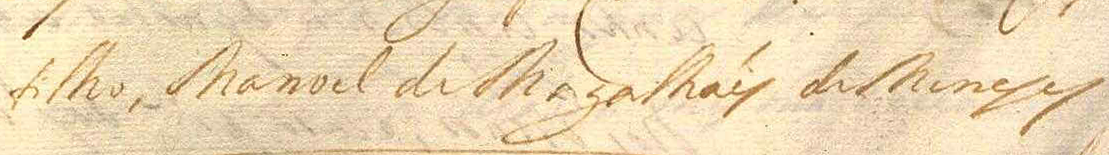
tilho, Manoel de Magalhaẽs de Meneses
